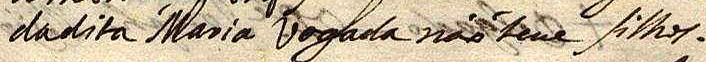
da dita Maria Vogada naõ teue filhos.
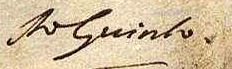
Ao Quinto
